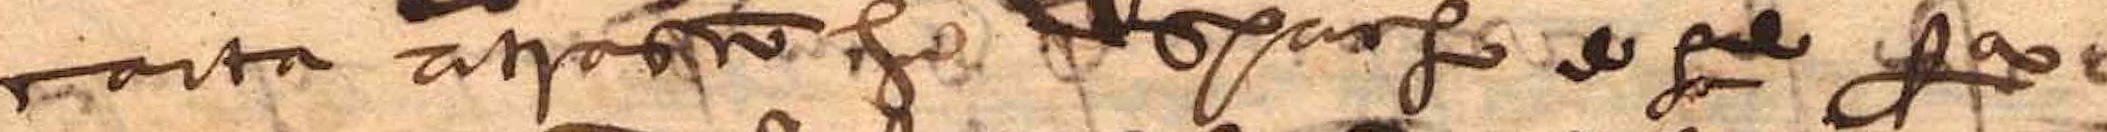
carta atras c̄o ho despacho do Ldo fco
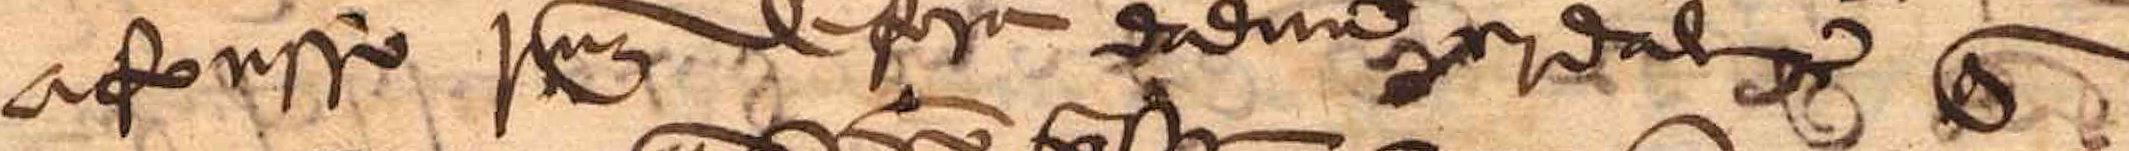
afonsso Juiz de fora da dita cjdade ē q̄
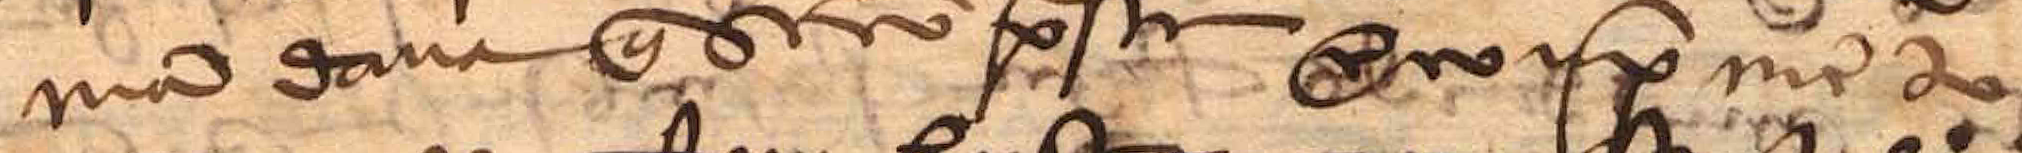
mādaua q̄ se c̄op̄sse ē conp̄mēto
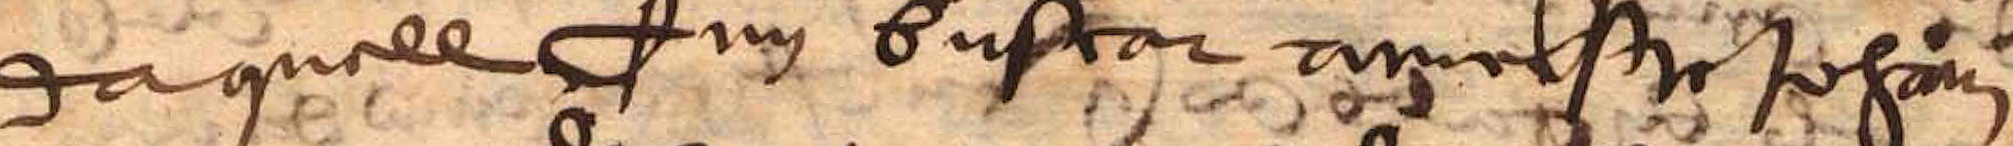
da quall fuy buscar a meestre Joham
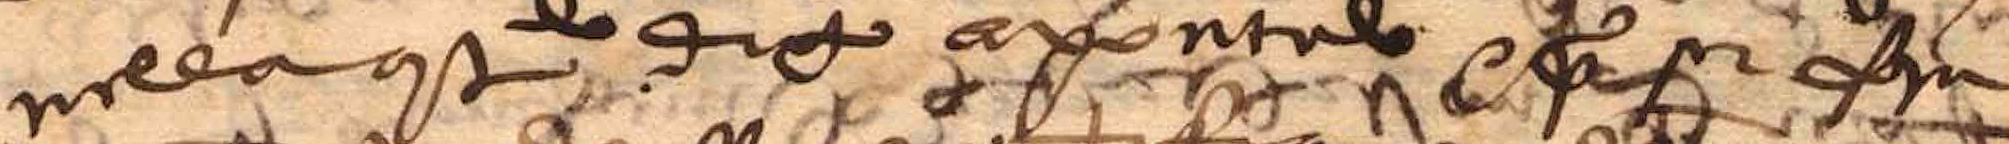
nella ꝯtdo digo apontado e p̄o ser fora
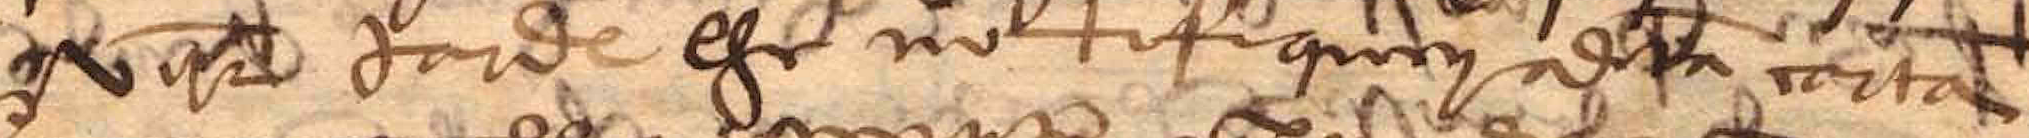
e vijr tarde lhe notifiquey a dita carta
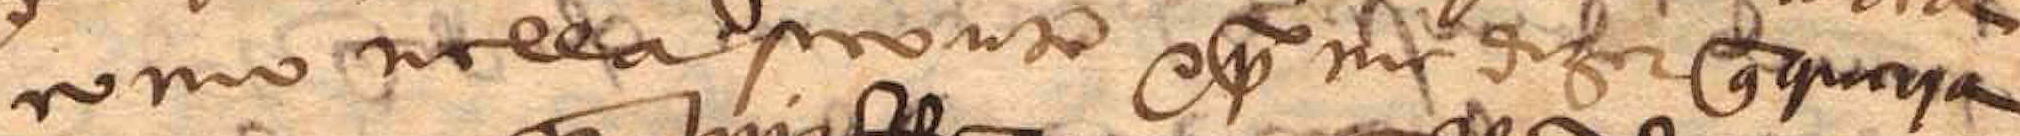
como nella se contē e p̄o me dizer q̄ querja
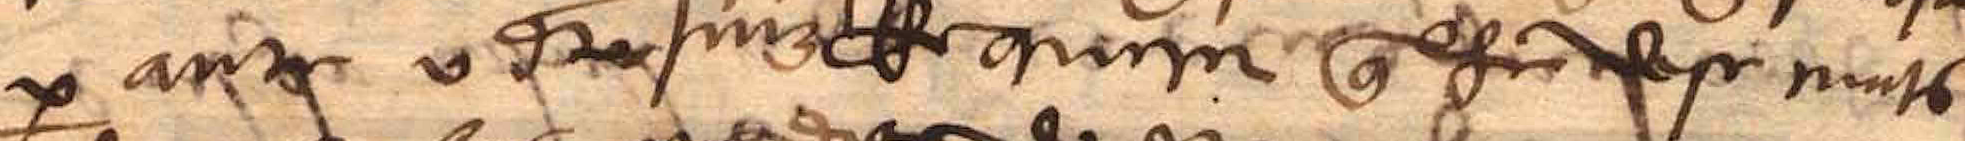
ꝑante o dt̄o Juiz Requerer q̄ lhe dese majs
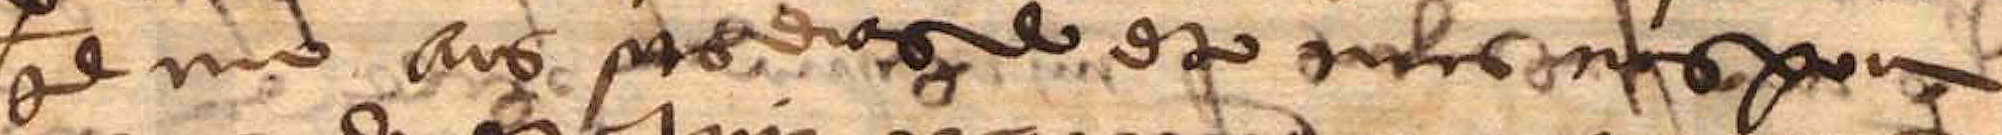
t̄mo aos seis dias do dto mes nas pou
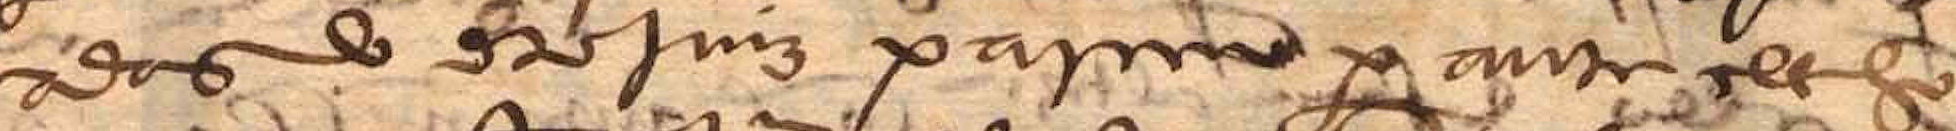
sadas do dto Juiz pareceo ꝑante elle ho
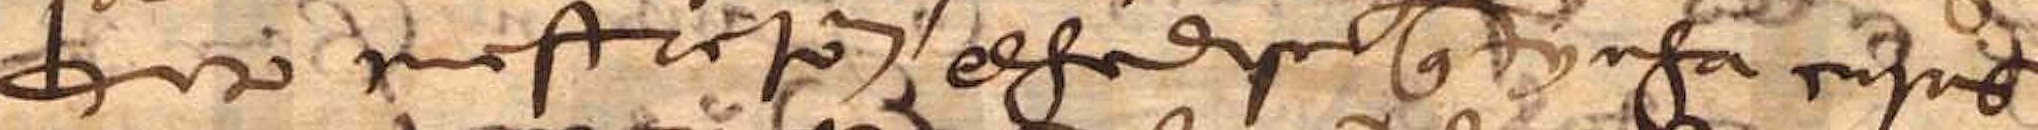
dito mestre Jom e lhe dise ē tynha curas
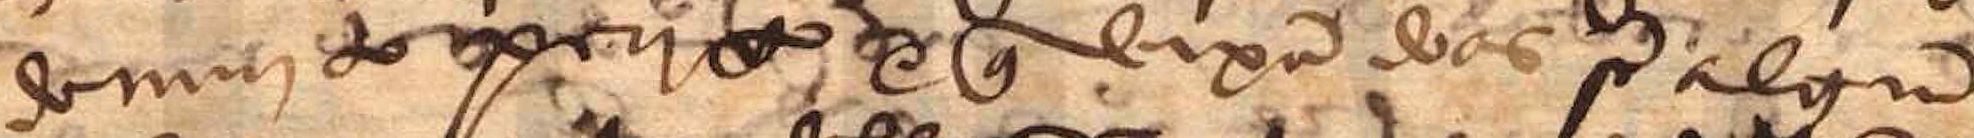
de mujto perjgo e q̄ dexādoas sē algū
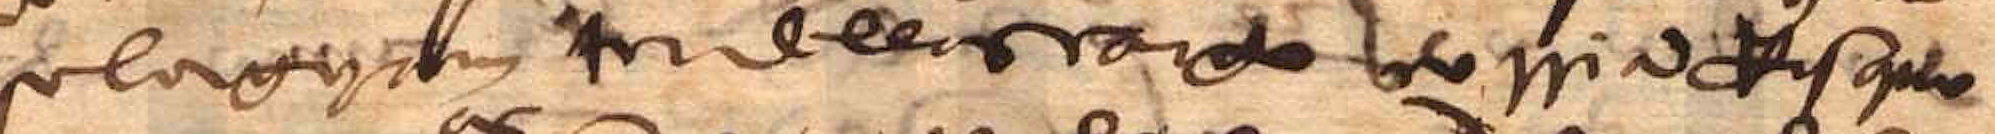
solorgyam ter dellas cargo corriā Risquo
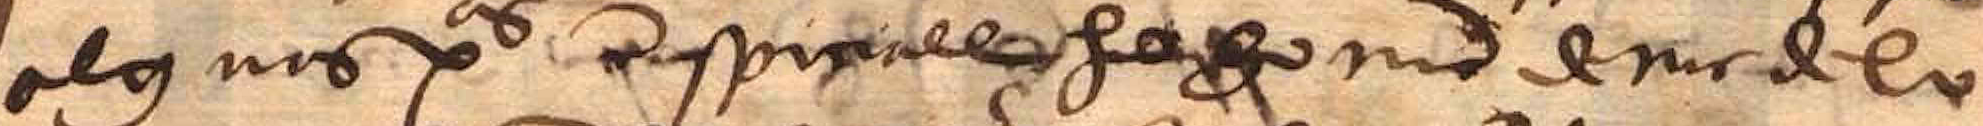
alguas pas ē spiciall ho homē de medelo
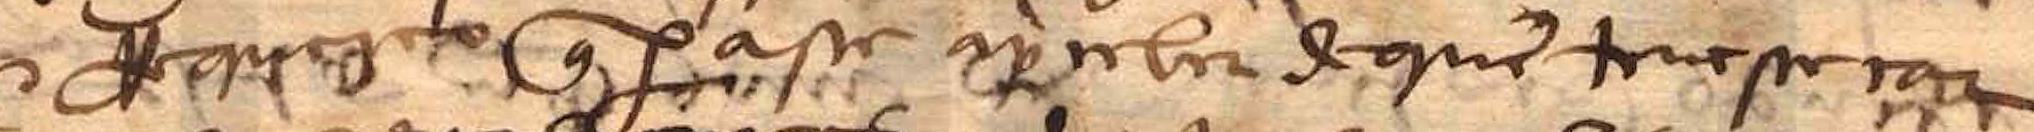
e Requereo q̄ ꝑa sse ap̄ceber de quē teuesse car
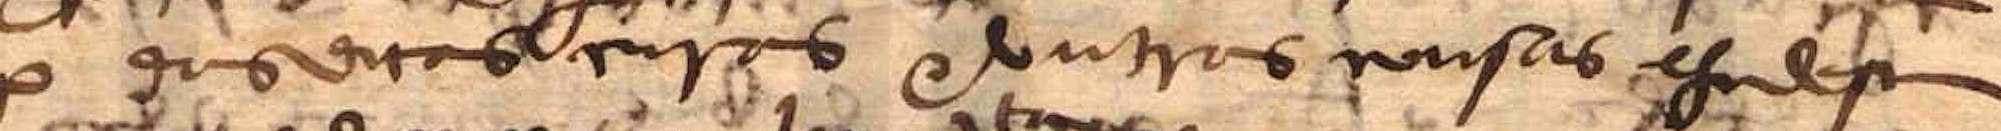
go das ditas curas e doutras cousas lhe dese
